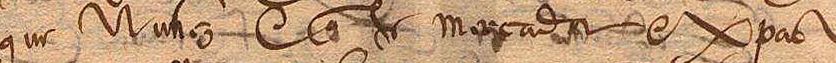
que Nun̄ez e q̄ he mercador e Xpaõ
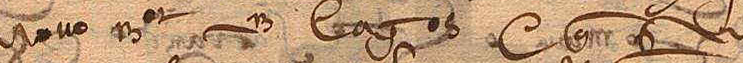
Nouo mor em lagos e q̄ seo
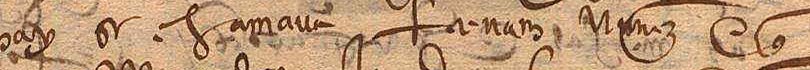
pay se chamaua fernam Nun̄ez e q̄
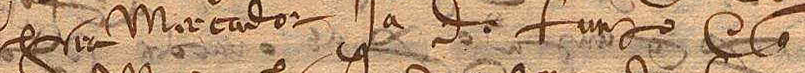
hera Mercador Ja defunto e q̄
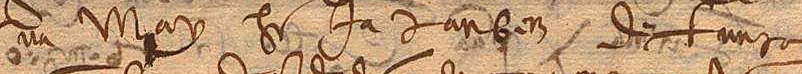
sua may he Ja tanbem defunta
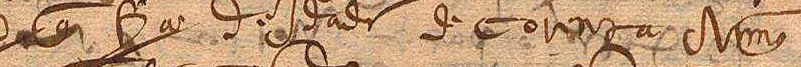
e q̄ ꞩa de Jdade de Corenta An̄nꝯ
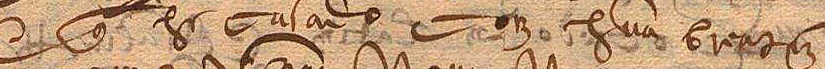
e q̄ he Casado Com hūa breatiz
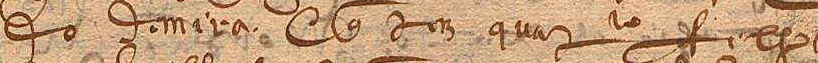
dodemira e q̄ tem quatro filhos
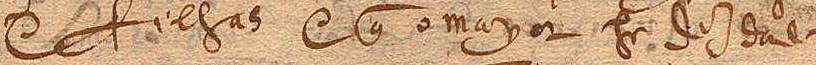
e filhas e q̄ o mayor he de Jdade
